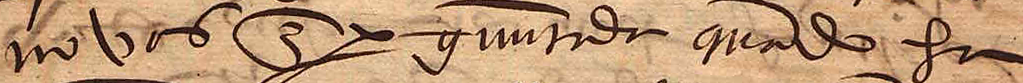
novas item ꝑgūntada quādo ha
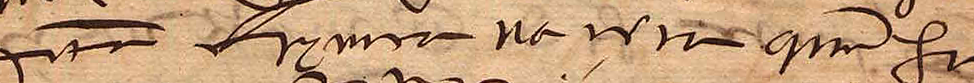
dita cryenca naçera quē ha
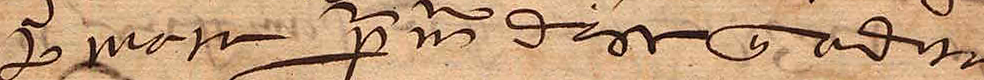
tomara prmro dyse q̄ a dita
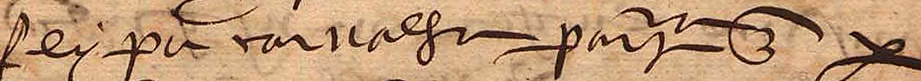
felypa carualha partra item ꝑ
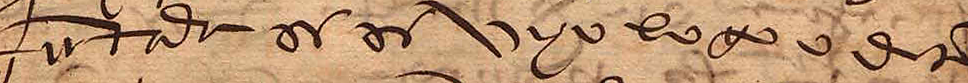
gūtada se se vyo logo o dito
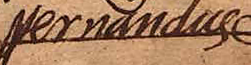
ffernandus
